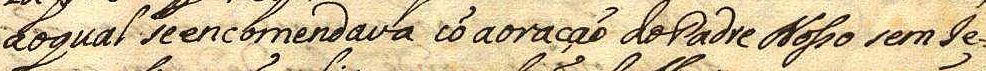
ao qual se encomendava cō a oraçaõ do Padre Nosso sem Ie
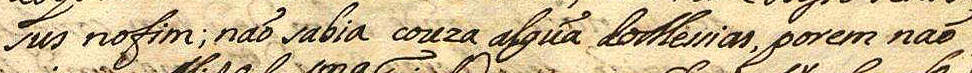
sus no fim; naõ sabia couza alguā do Messias, porem naõ
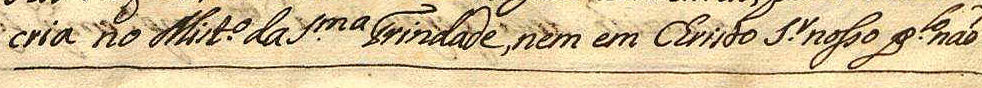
cria no Mist.o da S.ma Trindade, nem em Christo S.r nosso p.lo naõ
